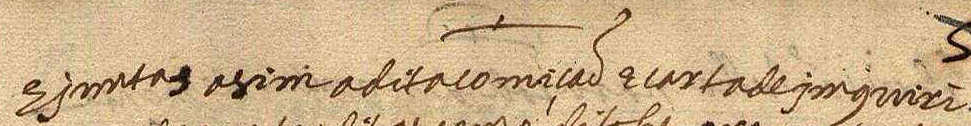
E juntas asim a dita comiçaõ E carta de jmquiri
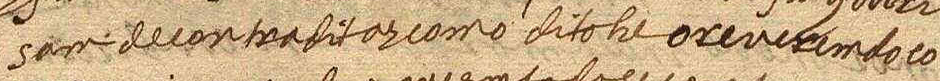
sam de contraditas como dito he o reueremdo co
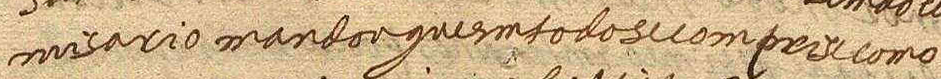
misario mandou que Em todo se comprise como
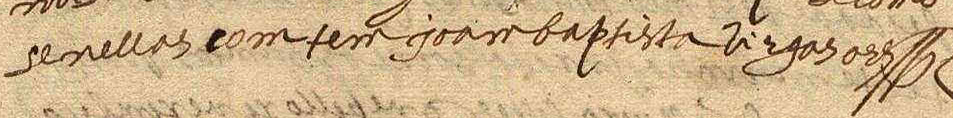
se nellas comtem joam baptista viegas o Estp̄j
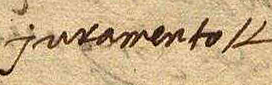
juramento // -
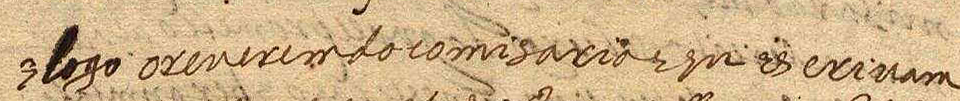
E logo o reueremdo comisario E Eu Escriuam
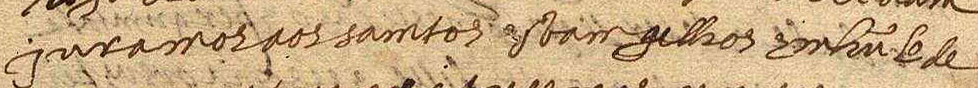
juramos aos samtos Evamgelhos Em hū Lo de
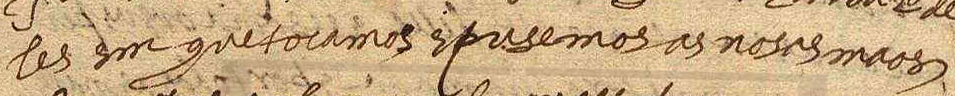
les Em que tocamos E pusemos as nosas maos
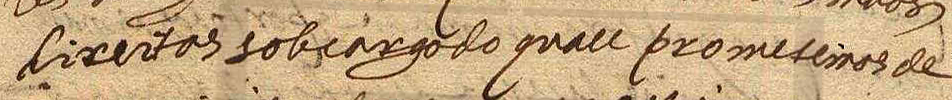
direitas sob cargo do quall prometemos de
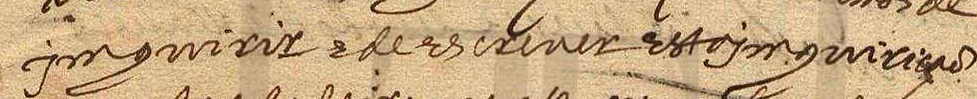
jmquirir E de Escreuer Esta jmquiriçaõ
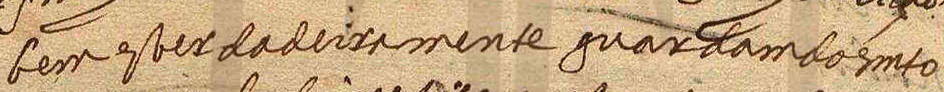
bem E verdadeiramente guardamdo Em to
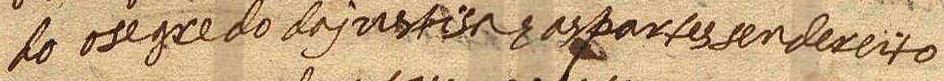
do o segredo da justisa E as partes seu dereito
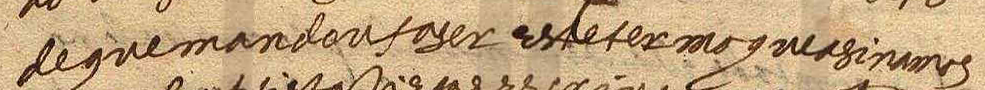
de que mandou fazer Este termo que asinamos
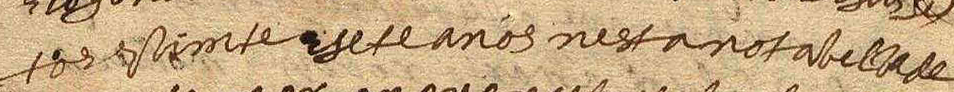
tos E vimte E sete anos nesta notavel va de
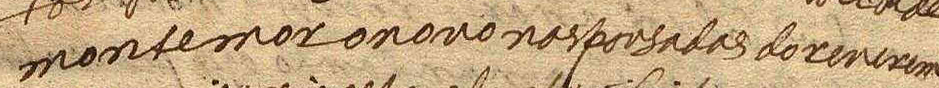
montemor o nouo nas pousadas do reuerem
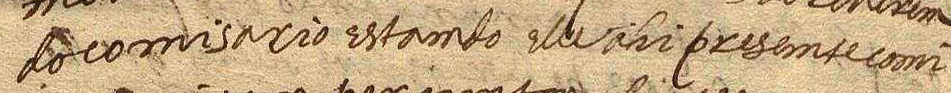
do comisario Estamdo Elle ahi presemte comi
